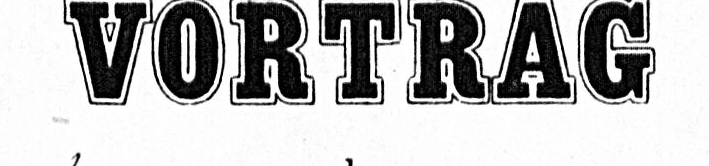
VORTRAG
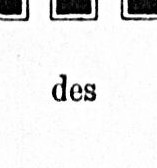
des
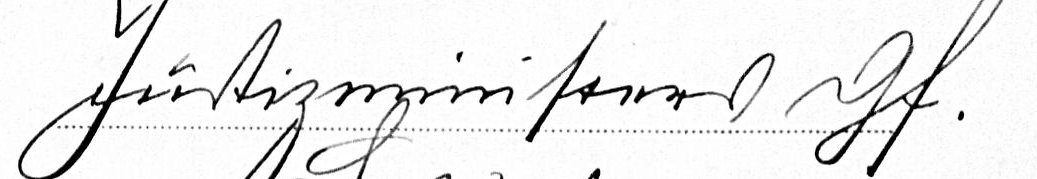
Justizministers Gf.
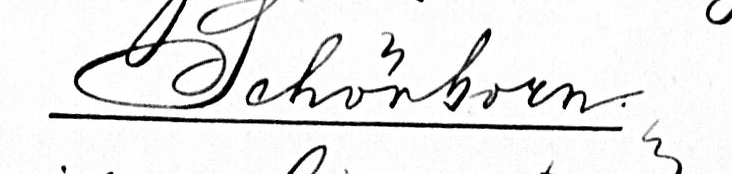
Schönborn.
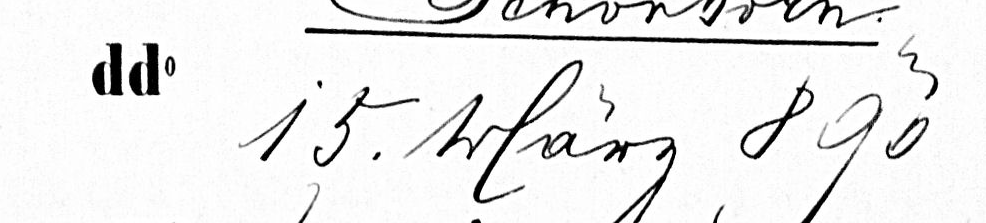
dd° 15. März 890
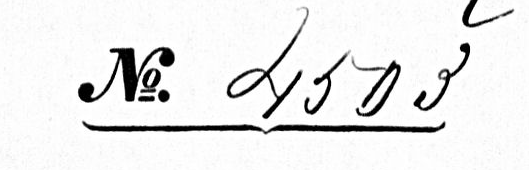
N° 4503
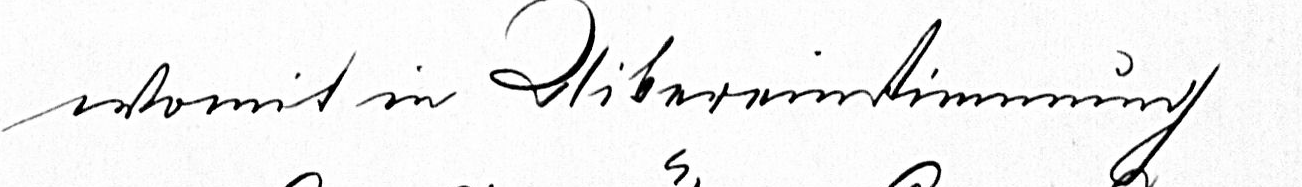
womit in Uibereintimmung
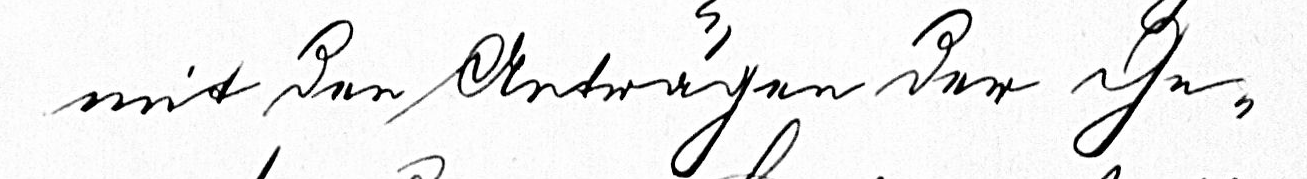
mit den Anträgen der Ge¬
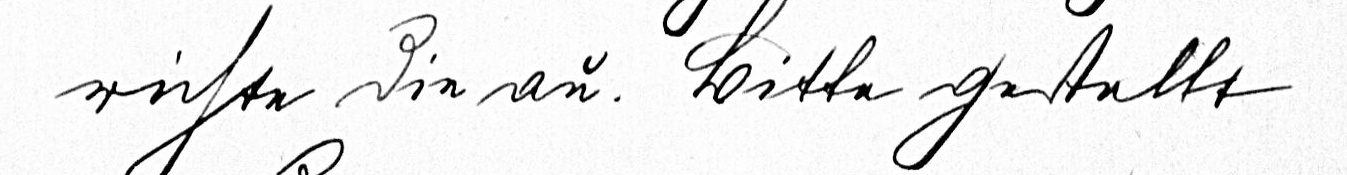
richte die au. Bitte gestellt
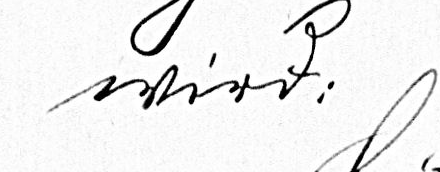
wird:
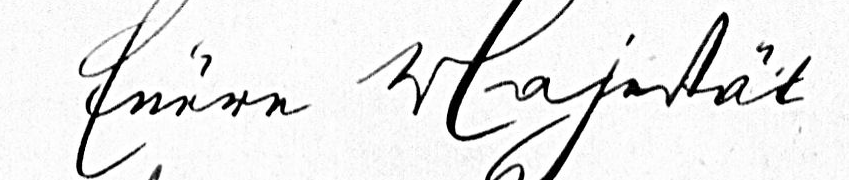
Euere Majestät
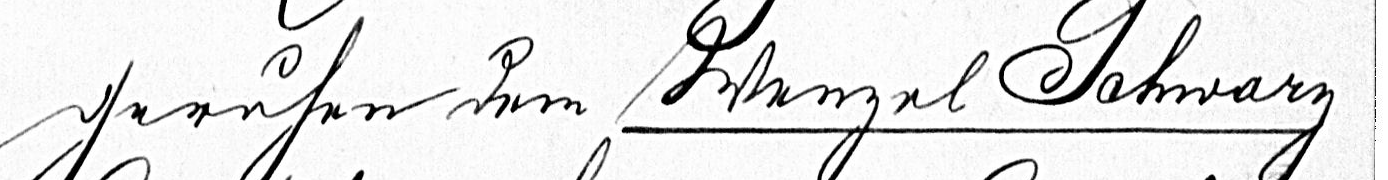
geruhen dem Wenzel Schwarz
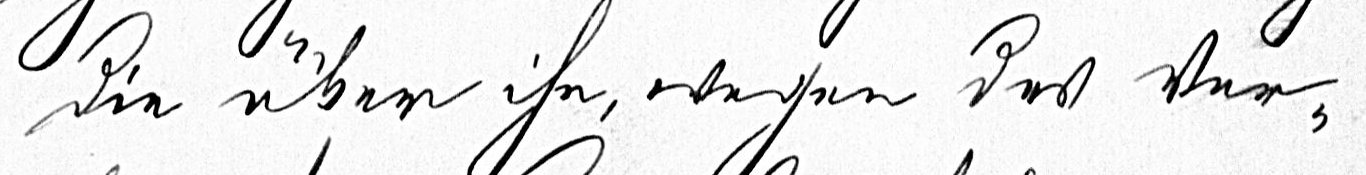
die über ihn, wegen des ver¬
